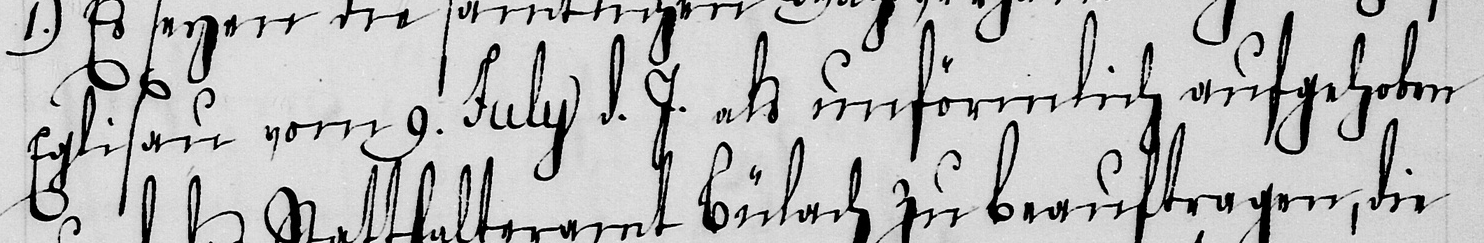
Eglisau vom 9. July d. J. als unförmlich aufgehoben
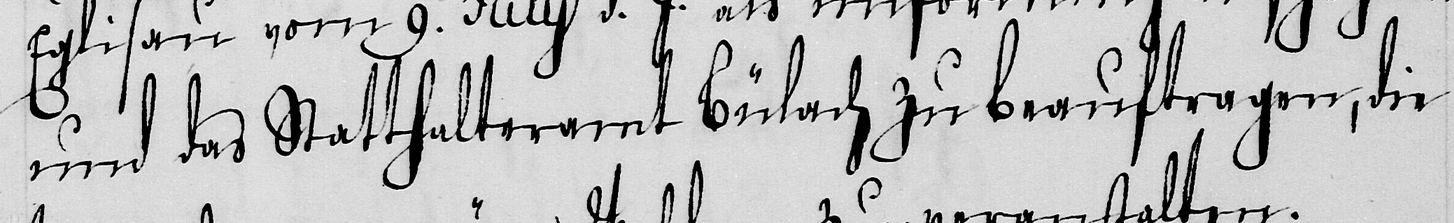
und das Statthalteramt Bülach zu beauftragen, die
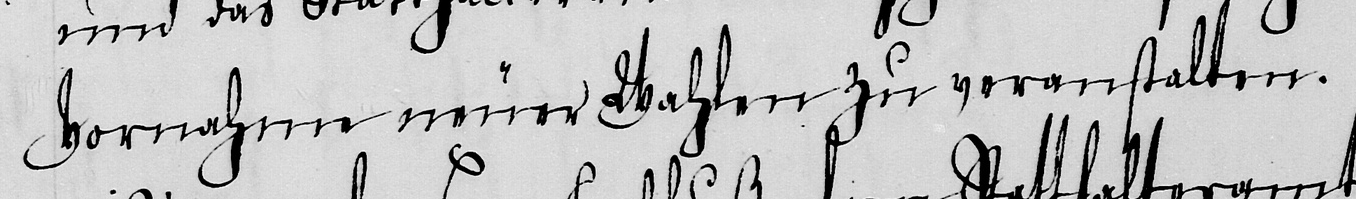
Vornahme neuer Wahlen zu veranstalten.
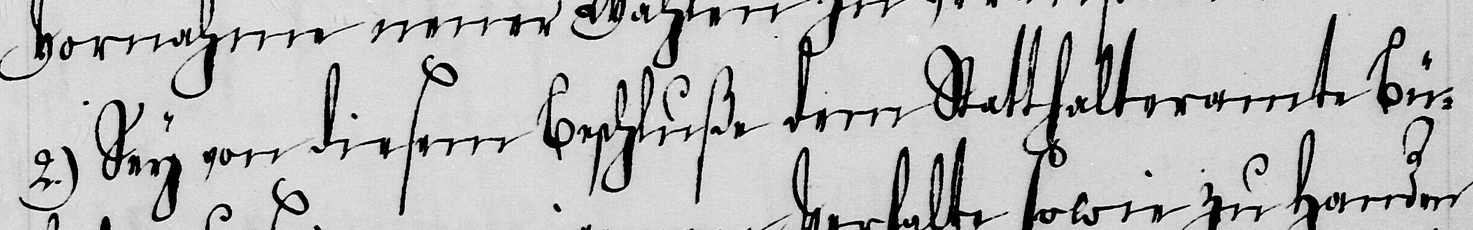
2.) Sey von diesem Beschluße dem Statthalteramt Bü¬
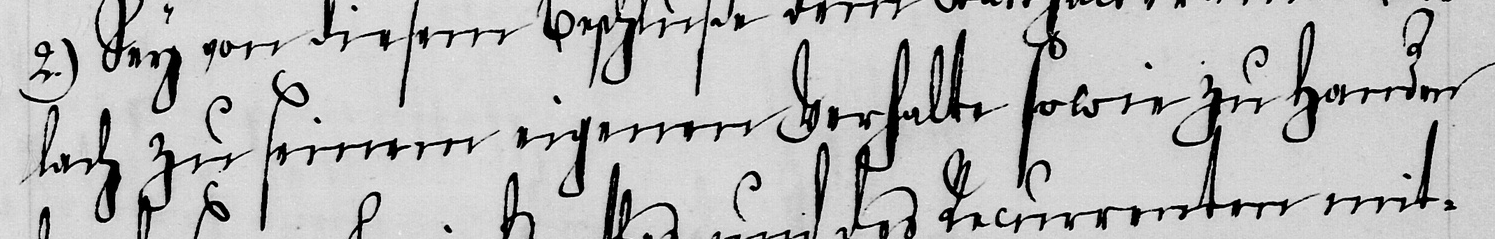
lach zu seinem eigenen Verhalte sowie zu Handen
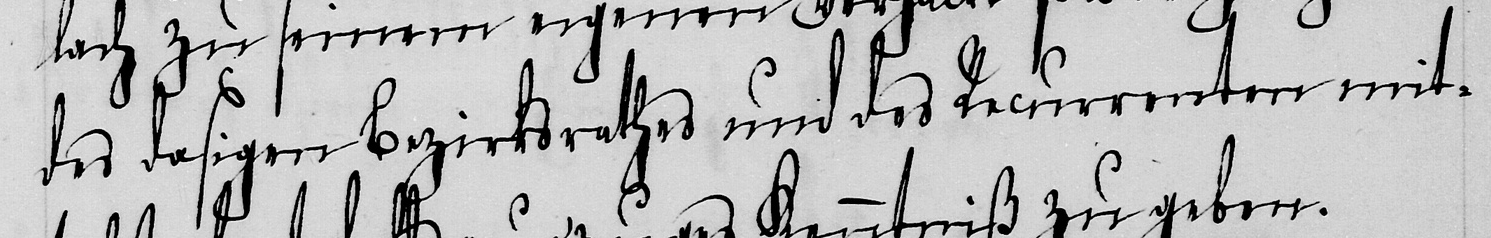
des dasigen Bezirksrathes und des Recurrenten mit¬
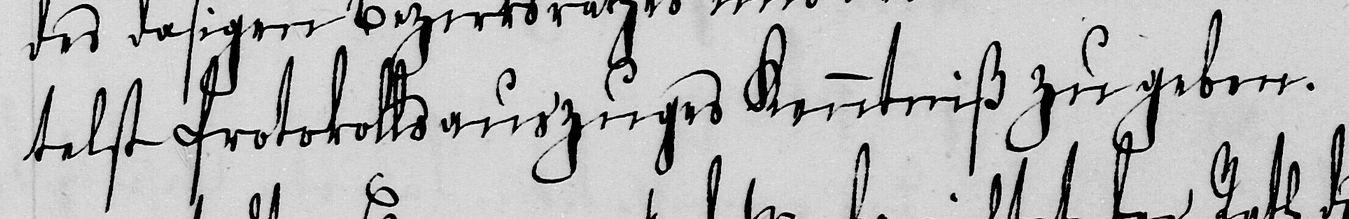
telst Protokollsauszuges Kentniß zu geben.
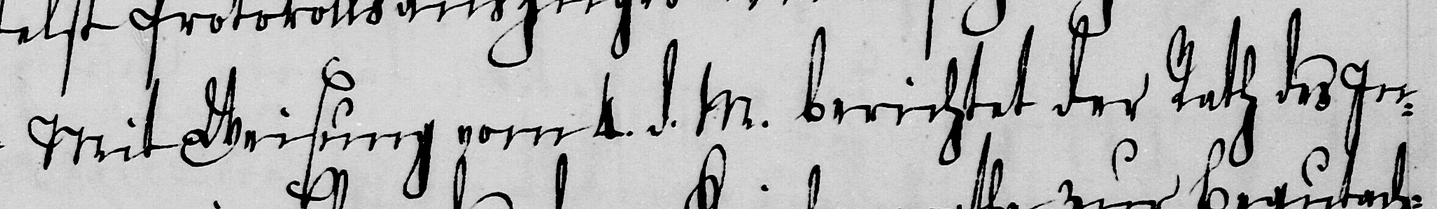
Mit Weisung vom 4. d. M. berichtet der Rath des In¬
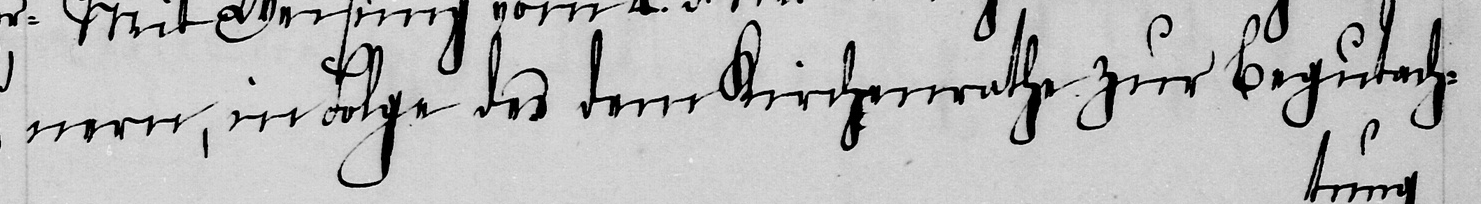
nern, in Folge des dem Kirchenrathe zur Begutach-
